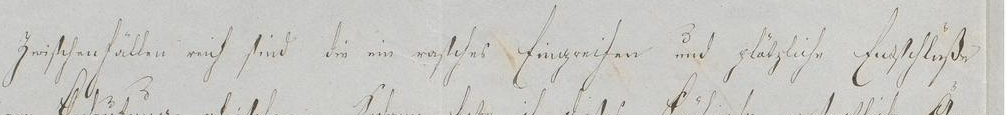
Zwischenfällen reich sind die ein rasches Eingreifen und plötzliche Entschlüße
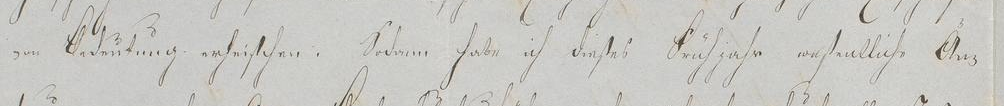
von Bedeutung erheischen. Sodann habe ich dieses Frühjahr wesentliche Än-
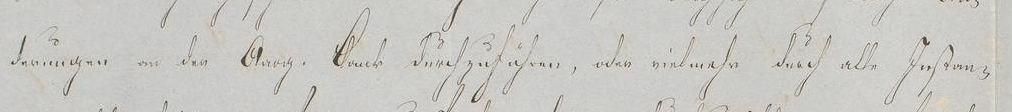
derungen an der Aarg. Bank durchzuführen, oder vielmehr durch alle Instan-
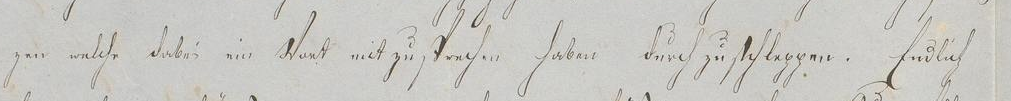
zen welche dabei ein Wort mitzusprechen haben durchzuschleppen. Endlich
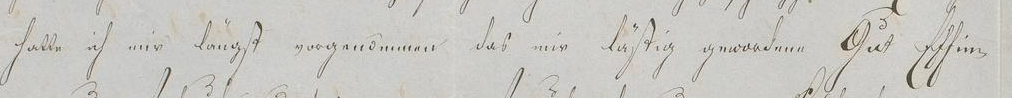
hatte ich mir längst vorgenommen das mir lästig gewordene Gut Effin-
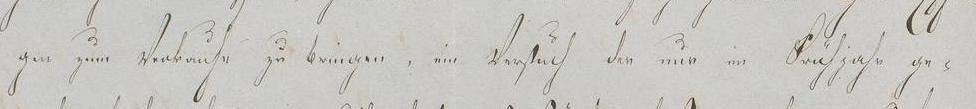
gen zum Verkaufe zu bringen, ein Versuch der nur im Frühjähr ge-
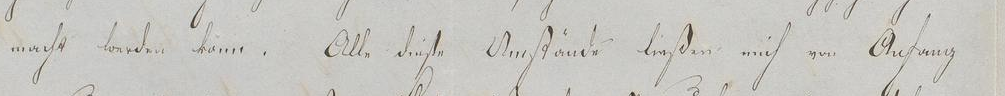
macht werden kann. Alle diese Umstände ließen mich von Anfang
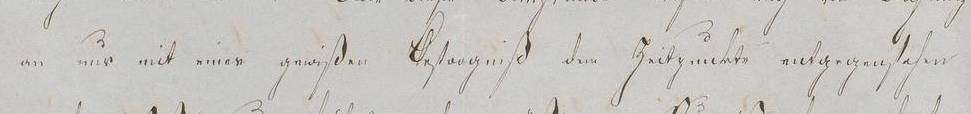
an nur mit einer gewißen Besorgniß dem Zeitpunkte entgegensehen
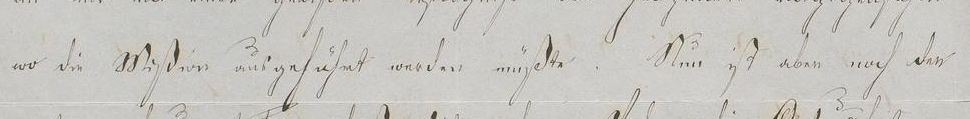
wo die Mißion ausgeführt werden müßte. Nun ist aber noch des
